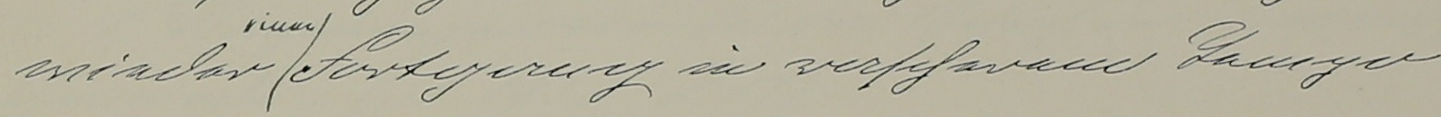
wieder Fortgang in rascherem Tempo
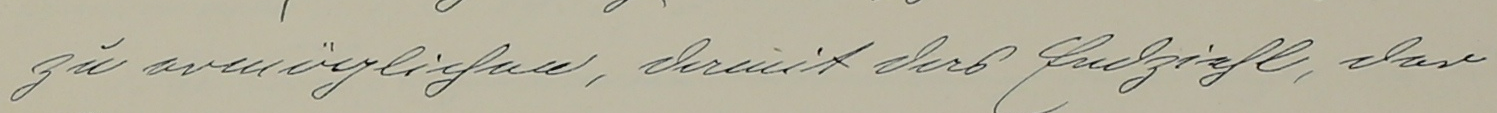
zu ermöglichen, damit das Endziehl, der
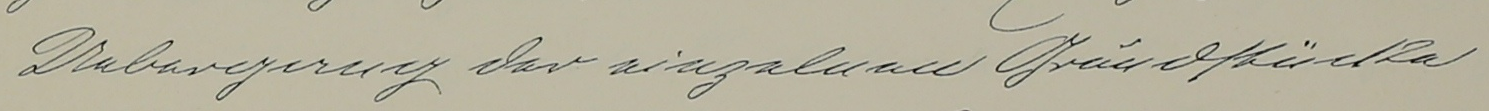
Uebergang der einzelnen Grundstücke
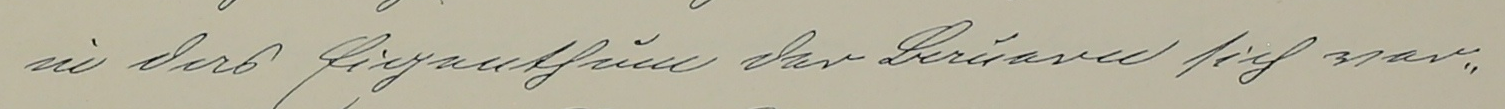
in das Eigenthum der Bauern sich ver-
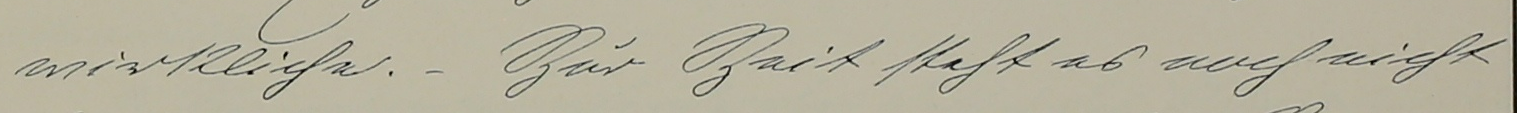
wirkliche. – Zur Zeit steht es noch nicht
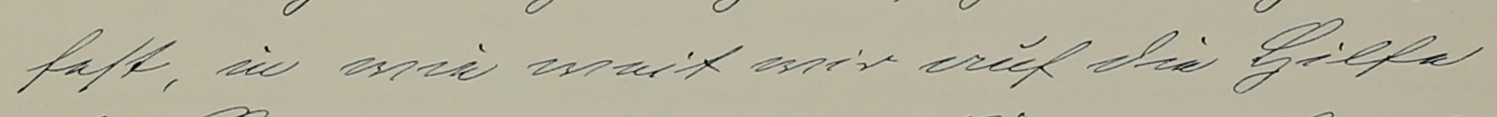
fest, in wie weit wir auf die Hilfe
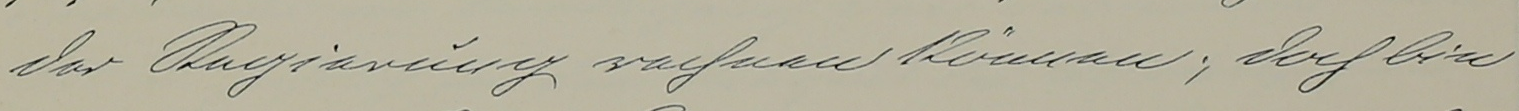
der Regierung rechnen können; doch bin
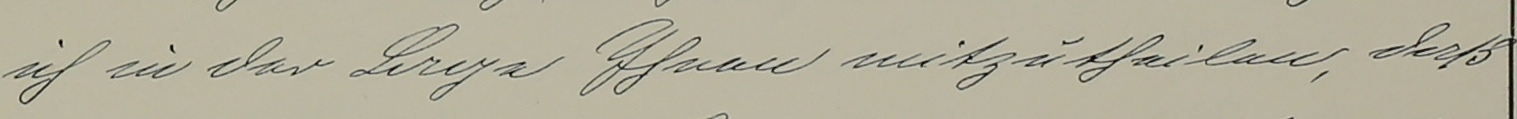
ich in der Lage, Ihnen mitzutheilen, daß
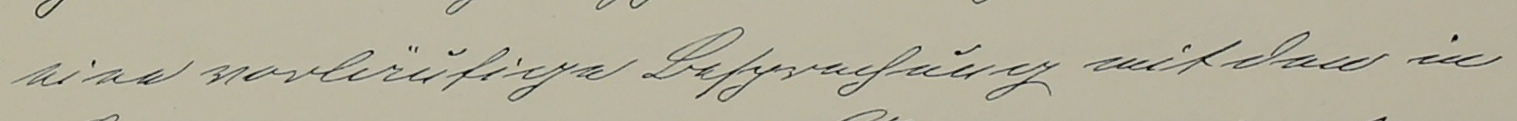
eine vorläufige Besprechung mit den in
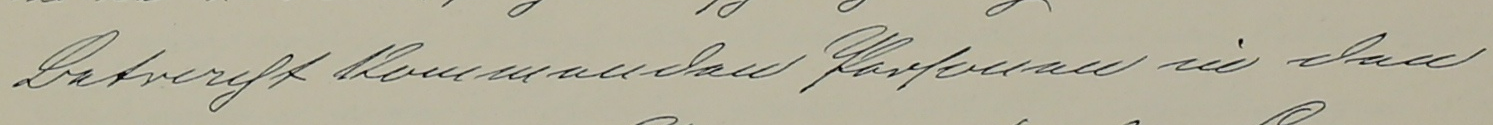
Betracht kommenden Personen in den
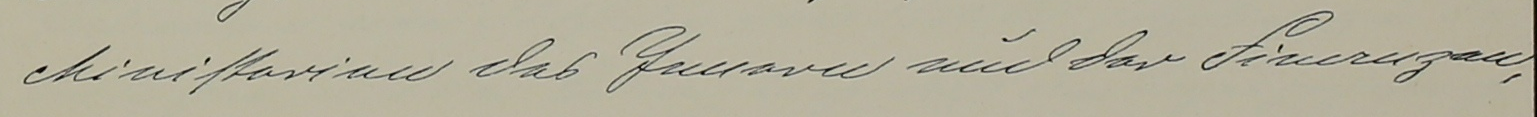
Ministerien des Innern und der Finanzen,
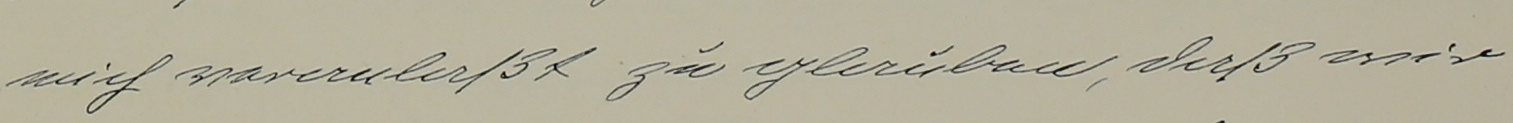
mich veranlaßt zu glauben, daß wir
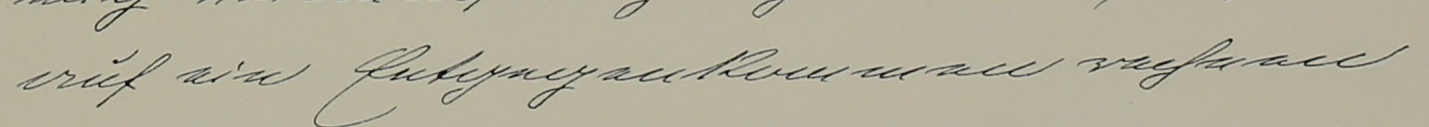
auf ein Entgegenkommen rechnen
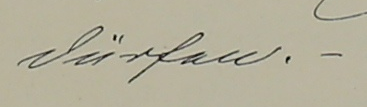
dürfen. -
